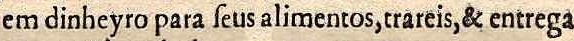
em dinheyro para seus alimentos, trareis, & entrega
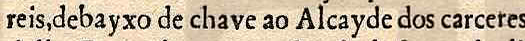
reis, debayxo de chave ao Alcayde dos carceres
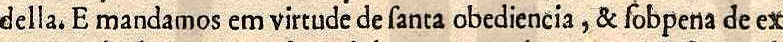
della. E mandamos em virtude de santa obediencia, & sob pena de ex
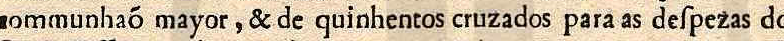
communhaõ mayor, & de quinhentos cruzados para as despezas do
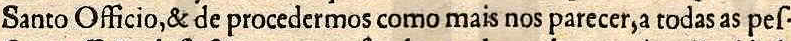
Santo Officio, & de procedermos como mais nos parecer, a todas as pes
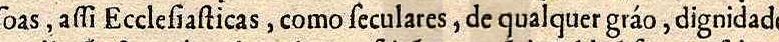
soas, assi Ecclesiasticas, como seculares, de qualquer gráo, dignidade
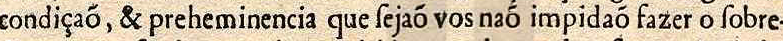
condiçaõ, & preheminencia que sejaõ vos naõ impidaõ fazer o sobre
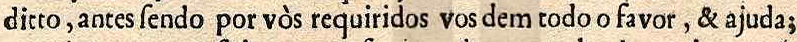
dicto, antes sendo por vòs requiridos vos dem todo o favor, & ajuda;
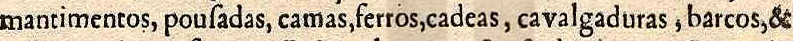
mantimentos, pousadas, camas, ferros, cadeas, cavalgaduras, barcos, &
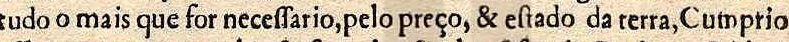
tudo o mais que for necessario, pelo preço, & estado da terra, Cumprio
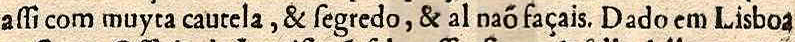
assim com muyta cautela , & segredo, & al naõ façais. Dado em Lisboa
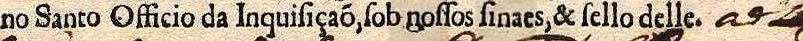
no Santo Officio da Inquisiçaõ, sob nossos sinaes, & sello delle. aos
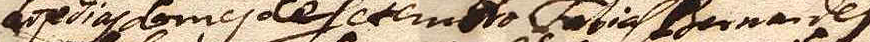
dose dias do mes de setembro Fabiaõ Bernardes
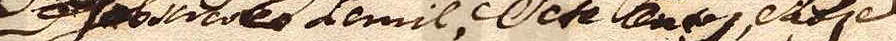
o sobscreveo de mil, e Setecentos, e doze
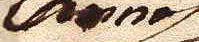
annos
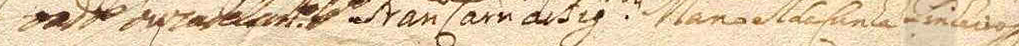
Joaõ de souza de Cast.o bro Franco Carnro de Figroa. Manoel da Cunha Pinheiro
